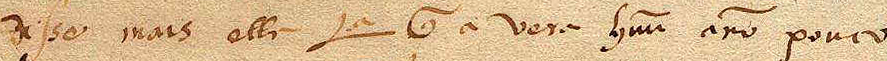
disse mais elle ta q̅ avera hu̅u an̅o pouco
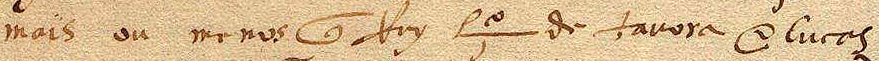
mais ou menos q̅ Ruy Lço de tauora e lucas
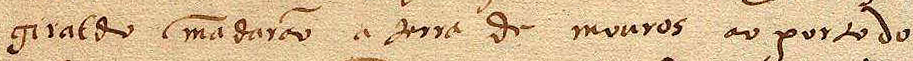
giraldo m̅adarão a terra de mouros ao porto do
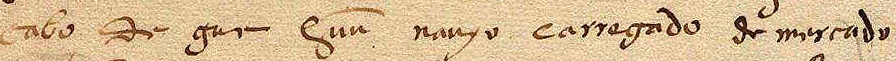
cabo de gue hu̅u nauyo carregado de mercado
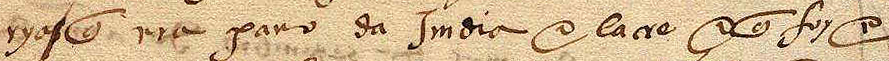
rya q̅ era pano da Jmdia e lacre e q̅ foy e̅
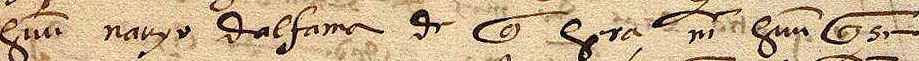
hu̅u nauyo dalfama de q̅ hera mte hu̅u q̅ se
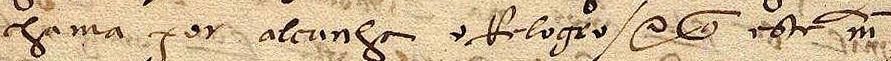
chama por alcunha o Relogeo / e q̄ este mte
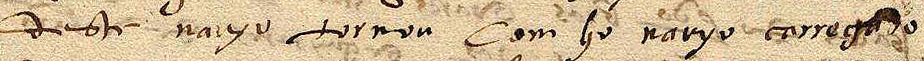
deste nauyo tornou com ho nauyo carregado
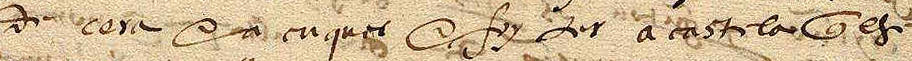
de cera e acuquer e foy ter a castela q̅ lhe
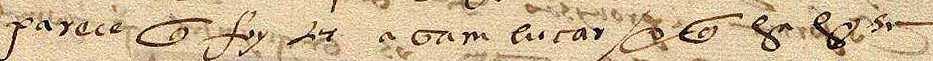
parece q̅ foy ter a sam lucar / e q̅ ha hy se
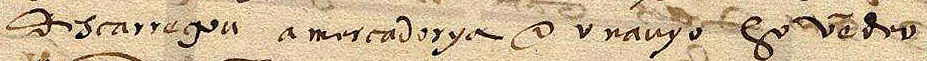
descarregou a mercadorya e o nauyo ho ve̅deo
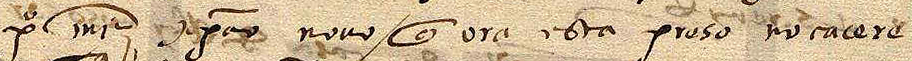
po m̅iz xpão nouo / q̅ ora esta preso no cacere
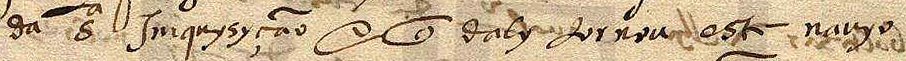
da sta Jmquysyç̅ao e q̅ daly tornou este nauyo
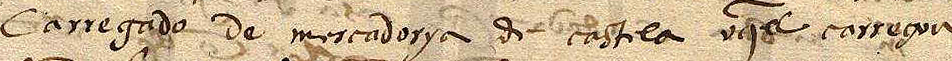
Carregado de mercadorya de castela o q̅ll carregou
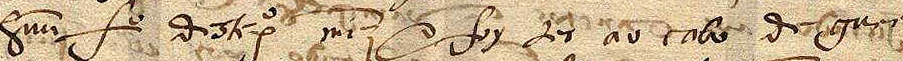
hu̅u fo deste po m̅iz e foy ter ao cabo de guee
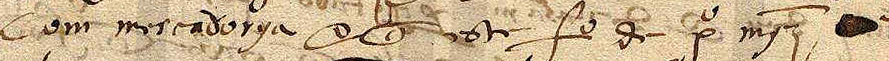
com mercadorya e q̅ este fo de po m̅yz se
